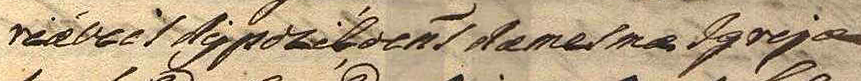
riáveis dispoziÇoeñs da mesma Igreja
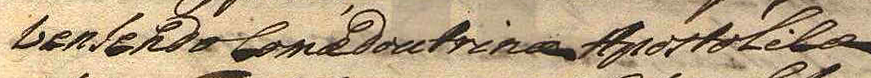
vensendo Com a doutrina ApostoLiCa
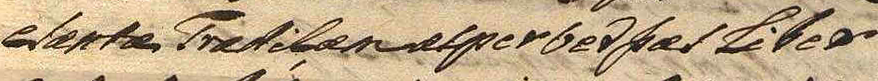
e santa TradiÇam as perversas Liber
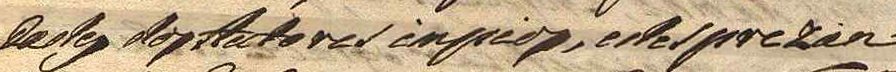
dades dos Autores impios, e desprezan
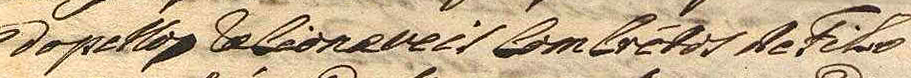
do pellos RaÇionaveis ComCrétos de FiLo
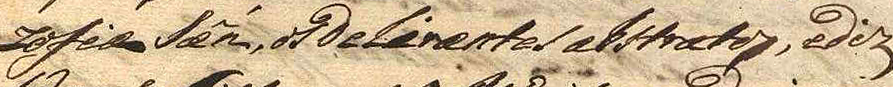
zofia Sân, os delirantes abstratos, e diz
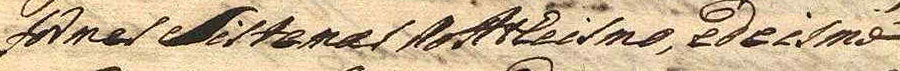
formes Sistemas do Atheismo, e deismo
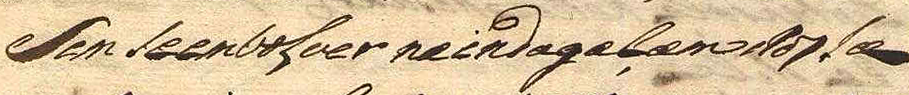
Sem se emvoLver na indagaÇam dos sa
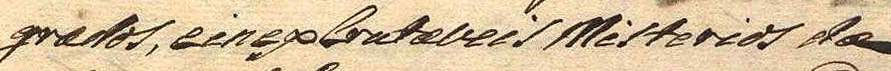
grados, e inexCrutaveis Misterios da
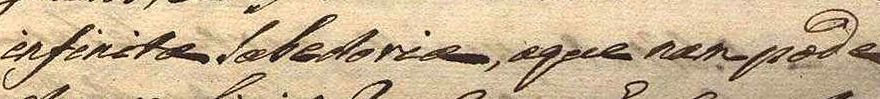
infinita sabedoria, a que nam pode
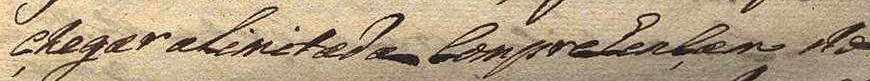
çhegar a Limitada ComprehenÇam do
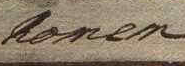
homem
